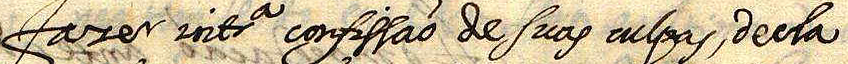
fazer intra confissaõ de suas culpas, decla
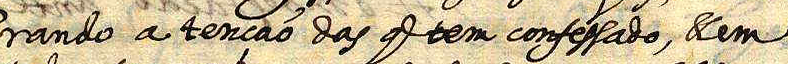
rando a tençaõ das q̄ tem confessado, & em
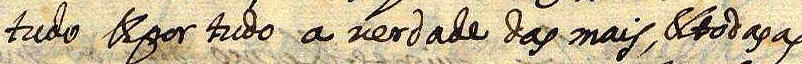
tudo & por tudo a uerdade das mais, & todas as
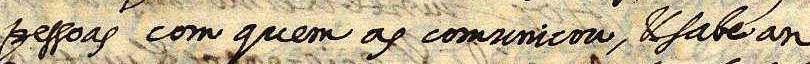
pessoas com quem as comunicou, & sabe an
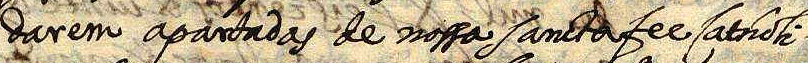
darem apartadas de nossa sancta fee Catholi
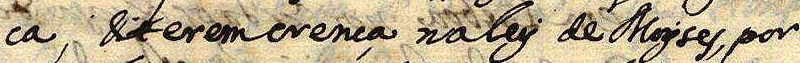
ca, & terem crença na ley de Moyses, por
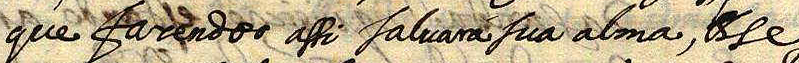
que fazendo o assi saluará sua alma, & se
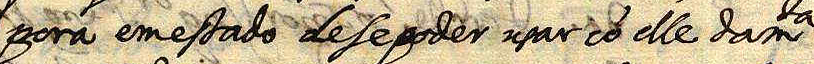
pora em estado de se poder usar cō elle da mta
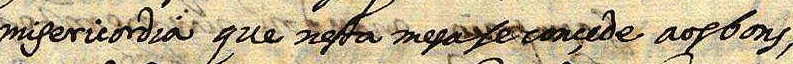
misericordia que nesta mesa se concede aos bons,
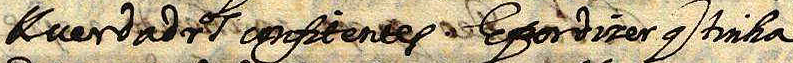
& uerdadros confitentes. E por dizer q̄ tinha
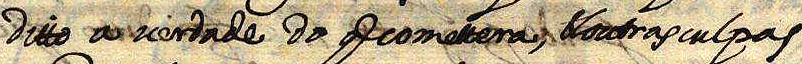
ditto a uerdade do q̄ comettera, & outras culpas
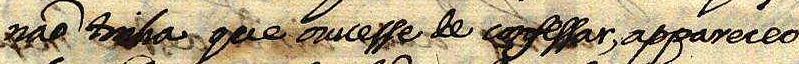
não tinha que ouuesse de confessar, appareceo
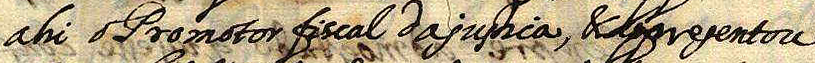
ahi o Promotor fiscal da justica, & appresentou
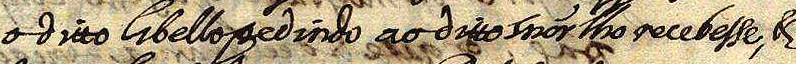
o ditto libello pedindo ao ditto snōr lho recebesse, &
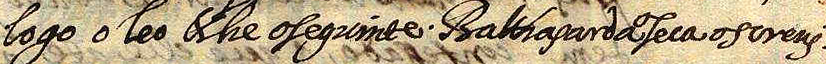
logo o leo & he o seguinte. Balthasar daoseca o escreuj.
